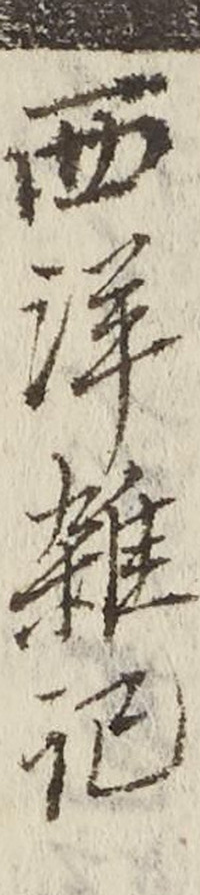西洋雑記
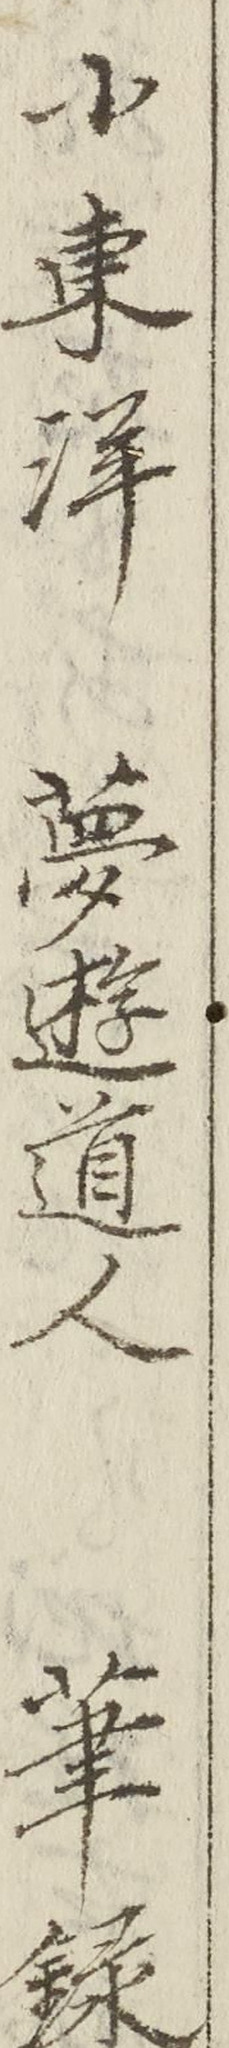小東洋夢遊道人筆録
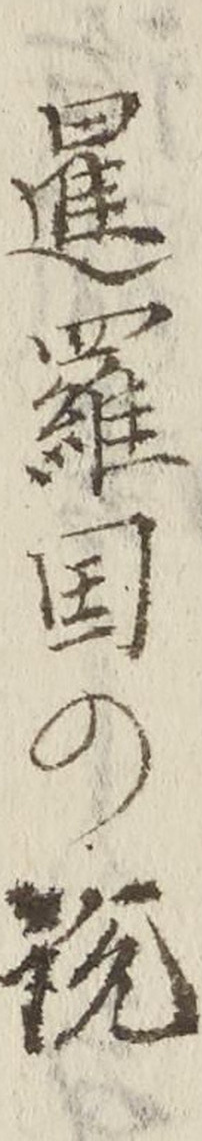暹羅国の説
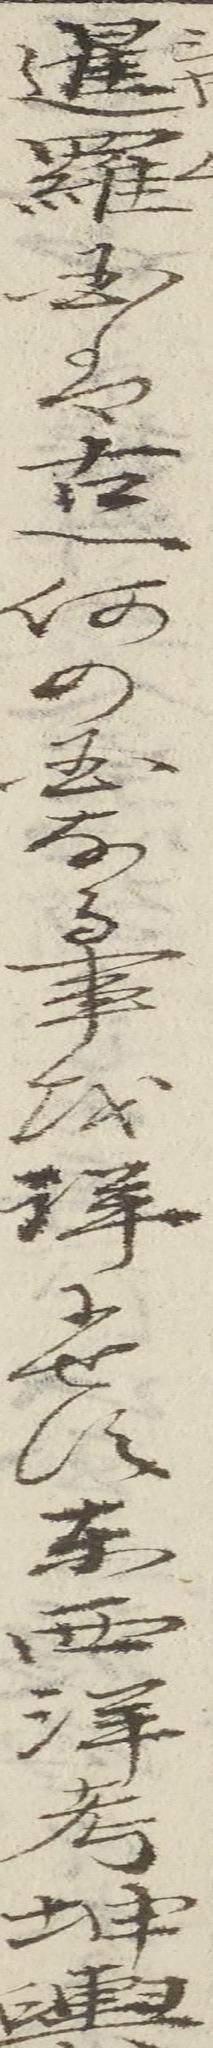暹羅国は古へ何の国なる事を詳にせす東西洋考坤興
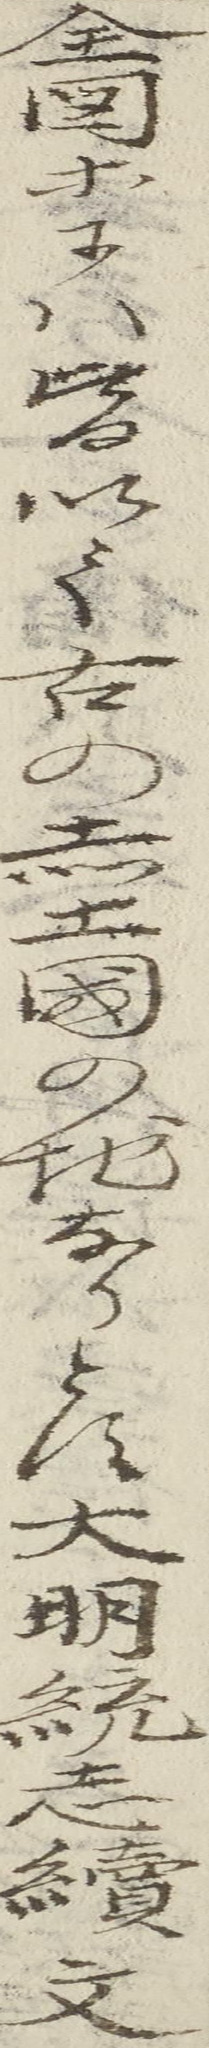全図等にハ皆以て古の赤土国の地なりとす大明統志続文
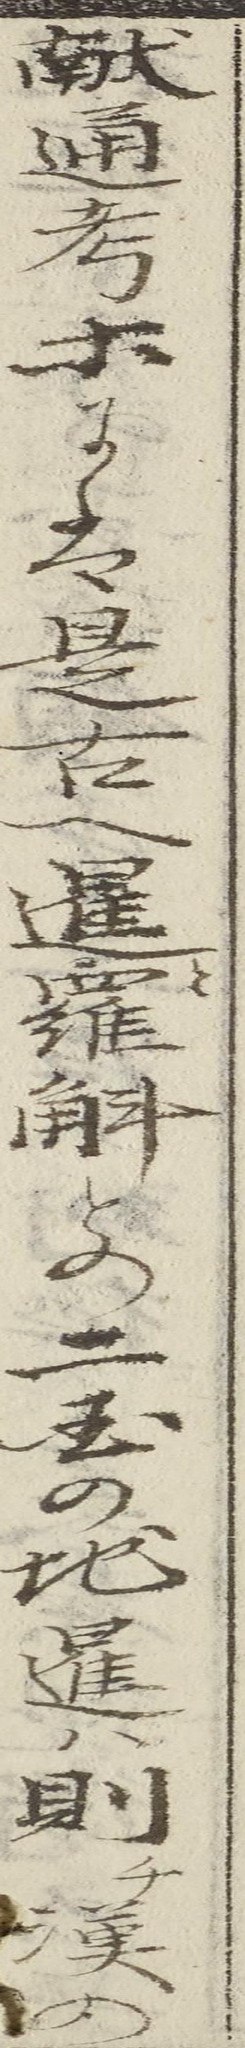献通考等には是古へ暹と羅斛との二国の地暹ハ則チ漢の
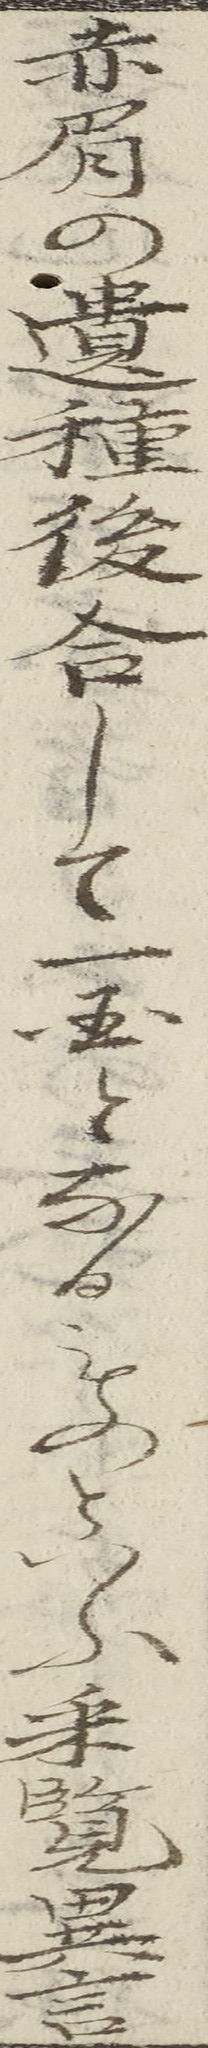赤眉の遣種後合して一国となるものといふ采覧異言
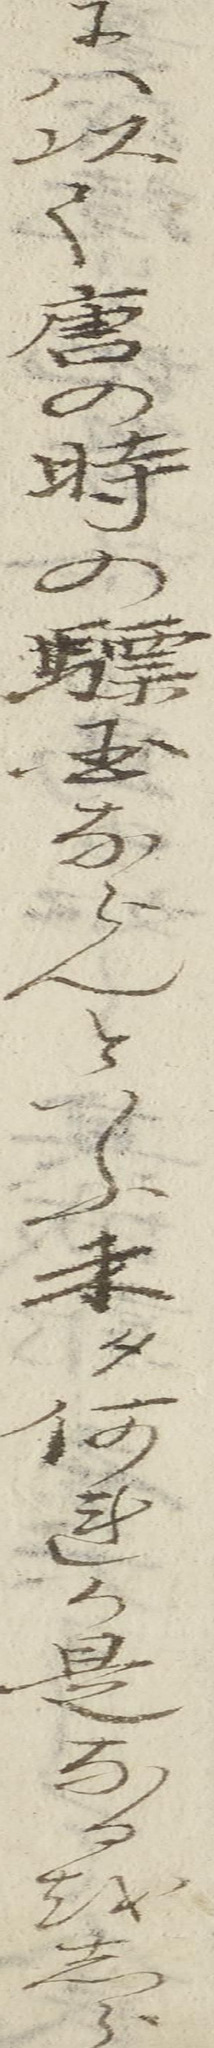にハ以て唐の時の驃国ならんといふ未タ何れの是なるをしら
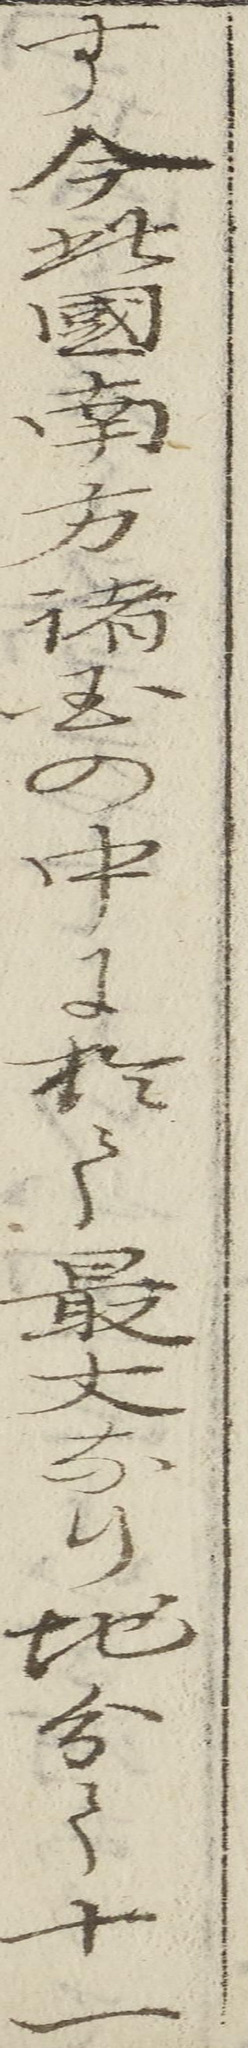す今此国南方諸国の中に於て最大なり地分て十一

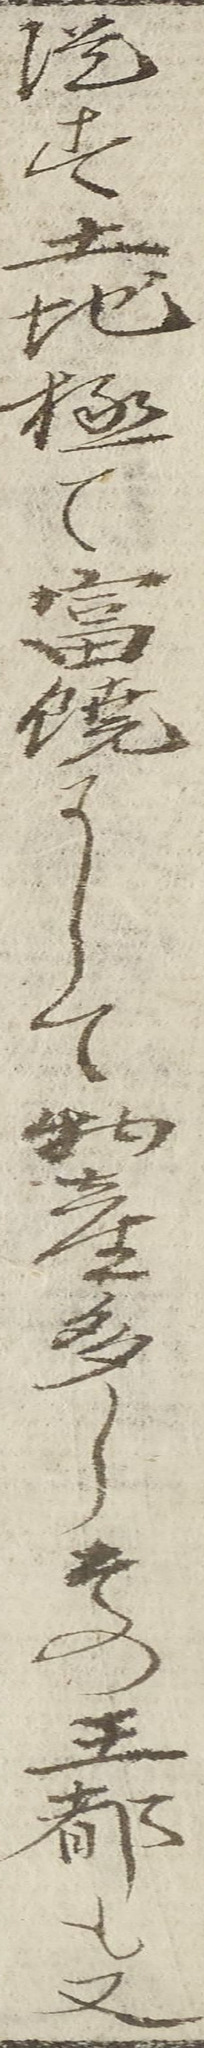従す土地極て富僥にして物産多しその王都も又
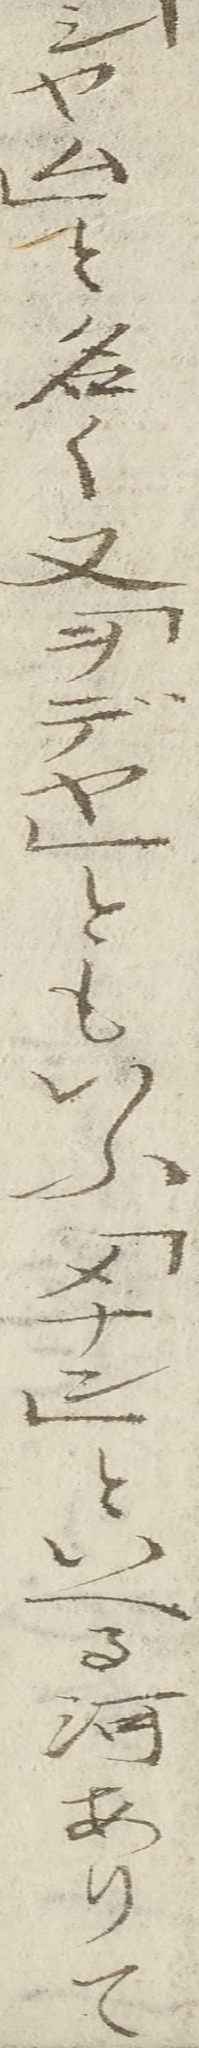「シヤム」てなく又「ヲデヤ」ともいふ「メナン」といへる河ありて
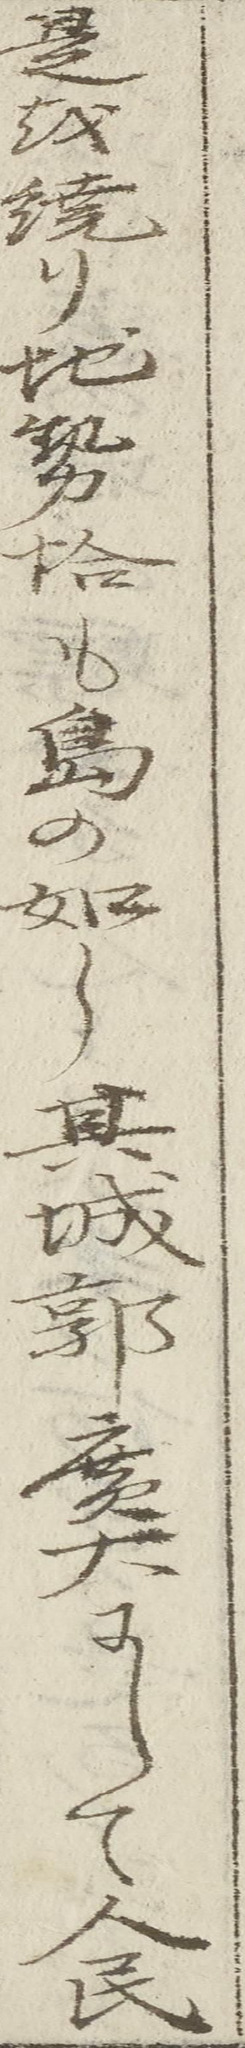是を続り地勢恰も島の如し其城郭広大にして人民
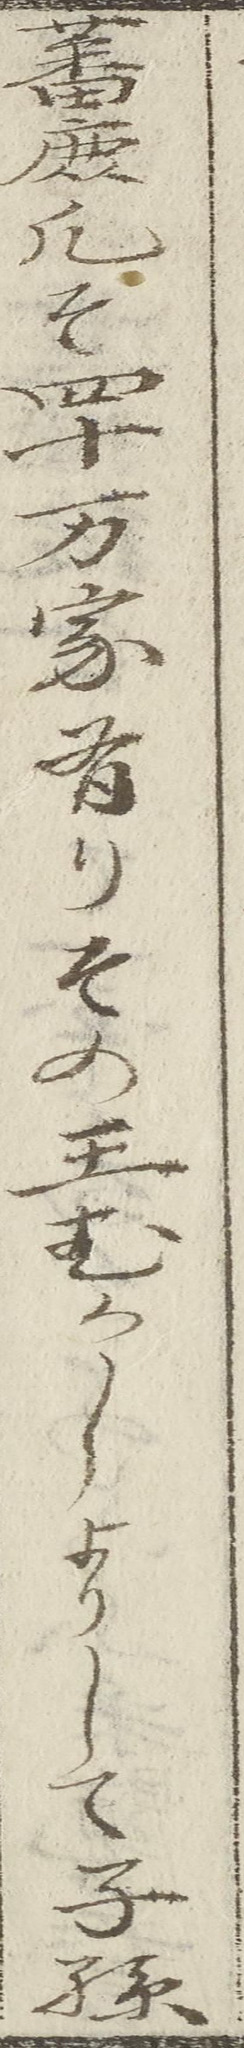蕃鹿凡そ四十万家有りその王むかしよりして子孫
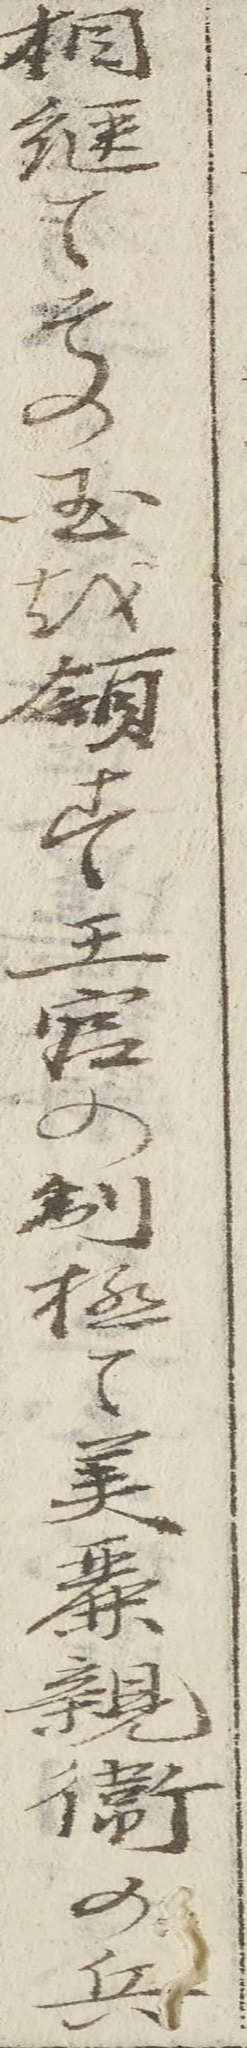相経てその国を領す王官の制極て美麗親衛の兵
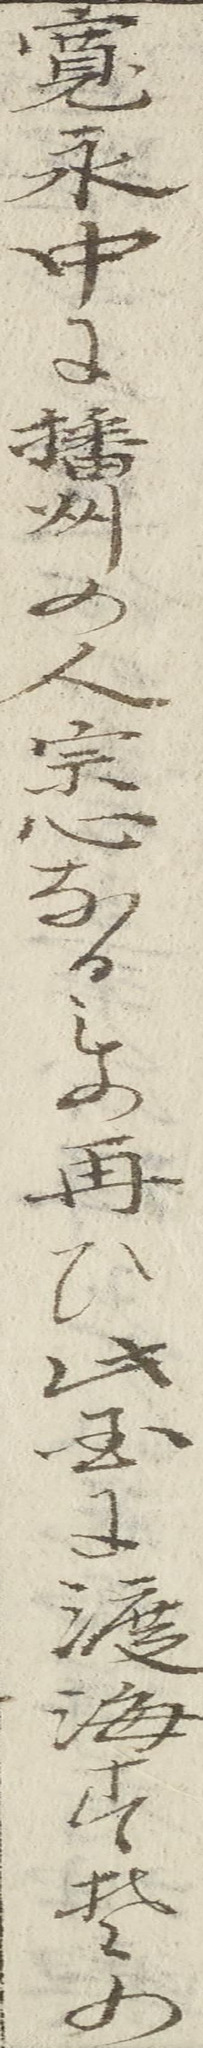寛永中に播州の人宗心なるもの再ひ此国に渡海すその
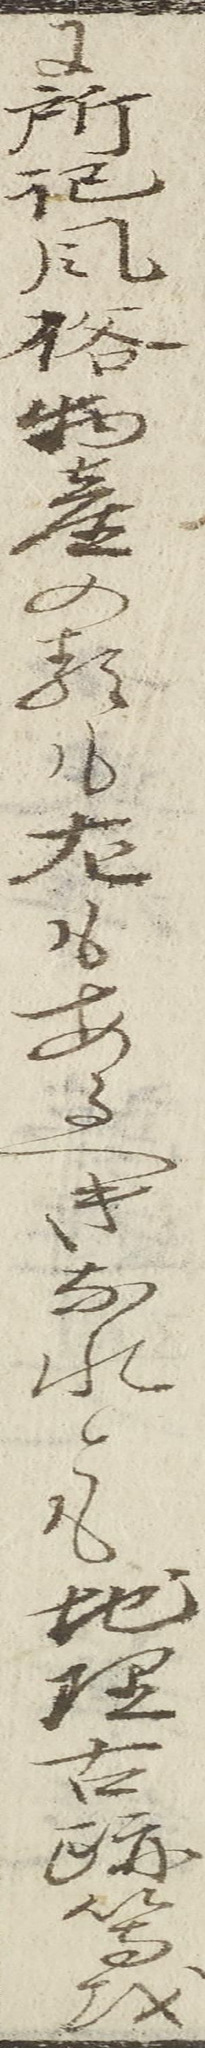に所記風俗物産の類も左もあるへきなれとも地理古跡等を
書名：西洋雜記　坤
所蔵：東京大学地震研究所図書室 Earthquake Research Institute Library, The University of Tokyo, JAPAN
